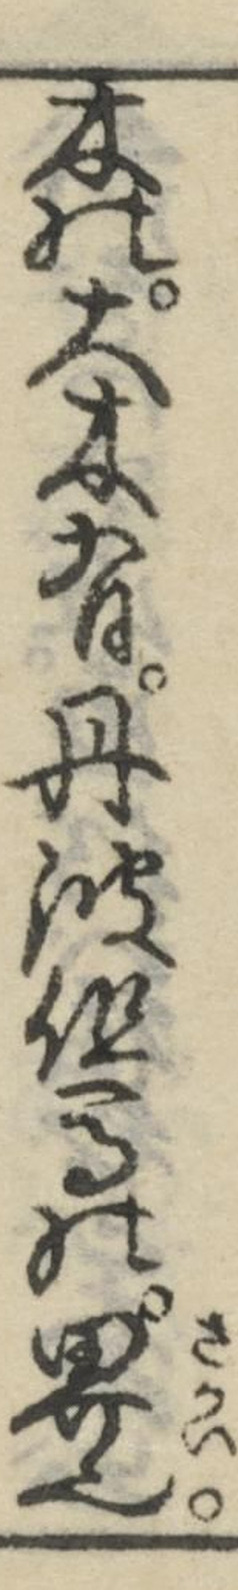木の。大木有。丹波但馬の。界也。
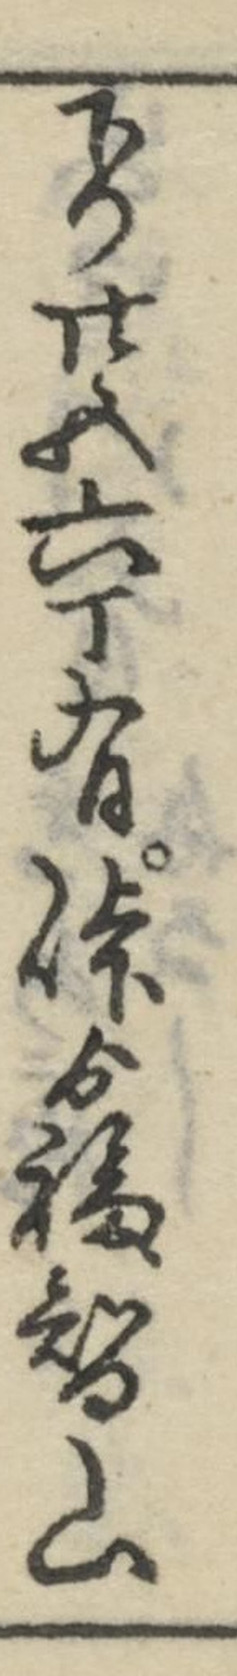下り廿五六丁有。峠ゟ福智山
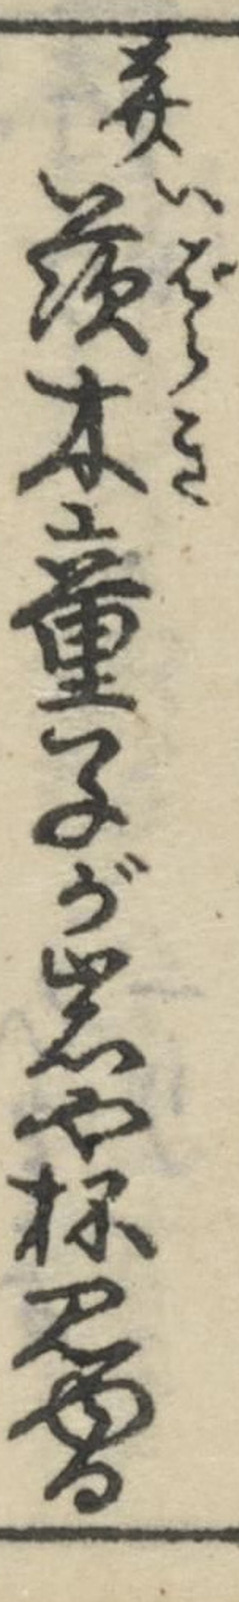并茨木童子が岩や抔見ゆる
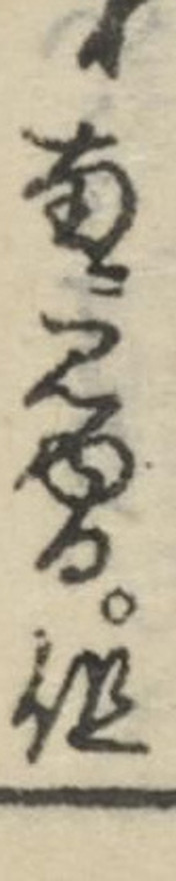南に見ゆる。但
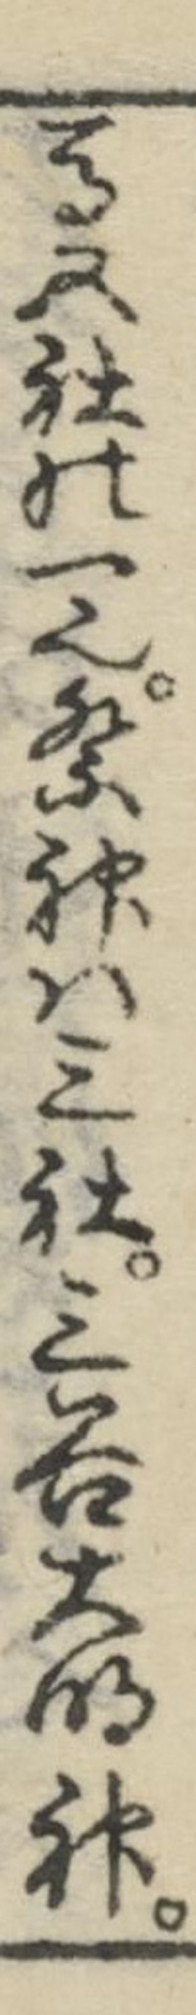馬五社の一也。祭神は三社。三谷大明神。
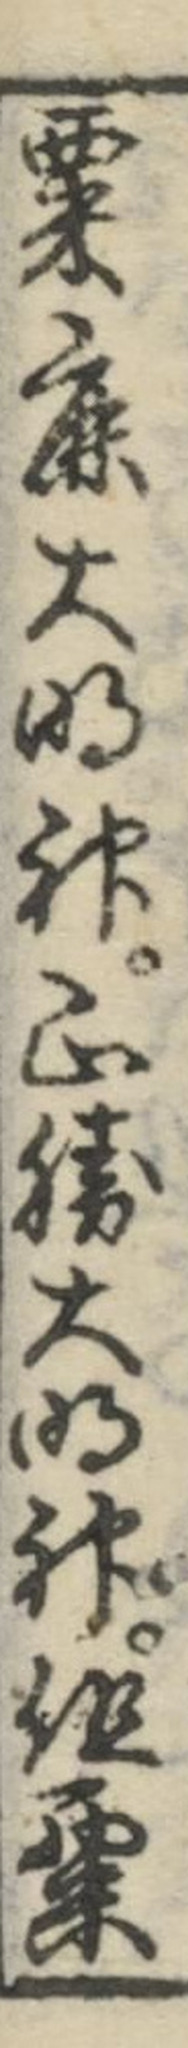粟鹿大明神。正勝大明神。但粟
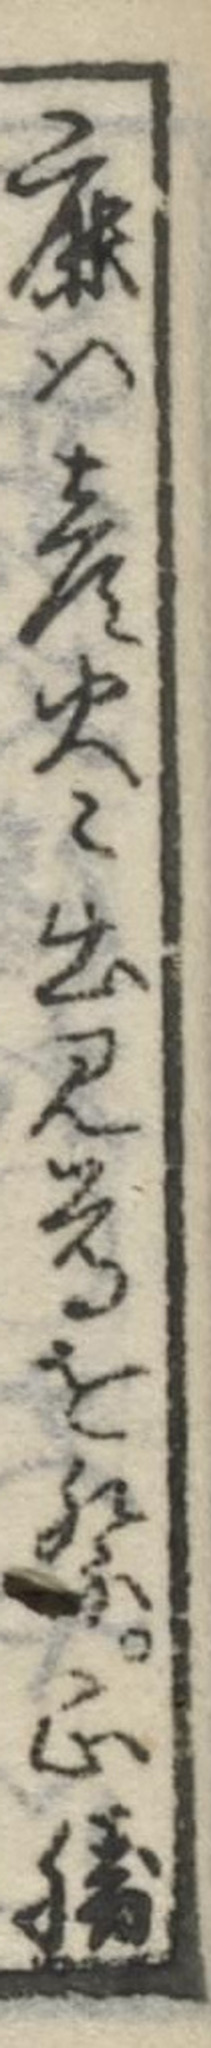鹿は彦炎出見尊を祭。正勝
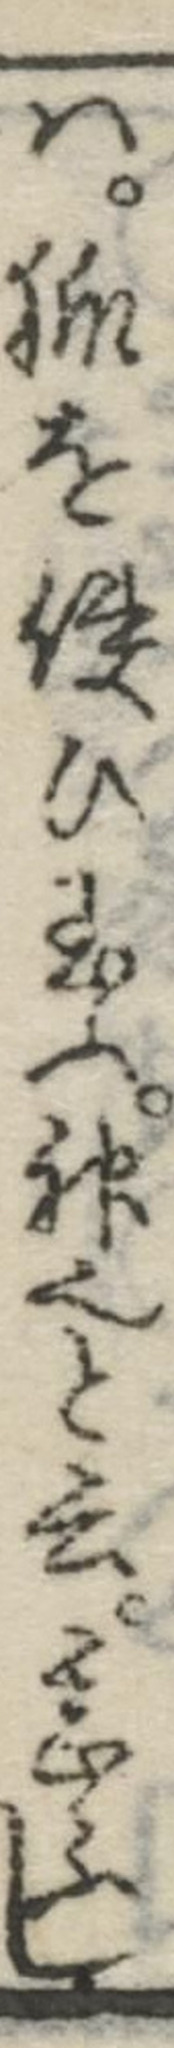は。狐を使ひ玉ふ。神也と云。甚ふし
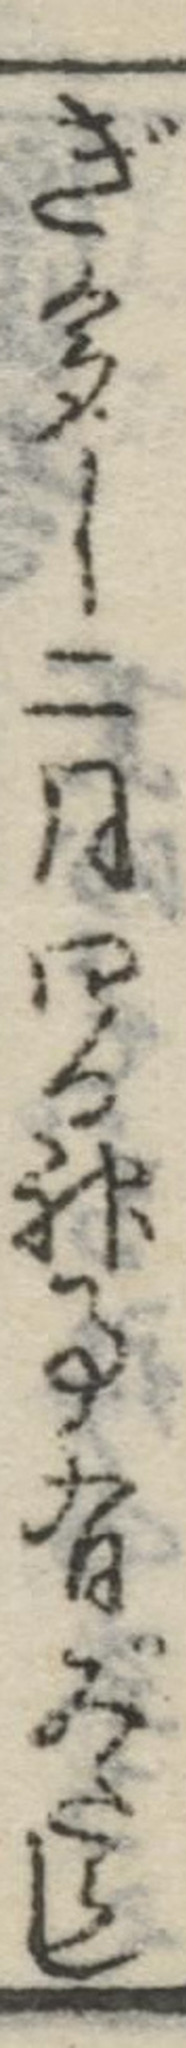ぎ多し二月四日神事有。みたらし
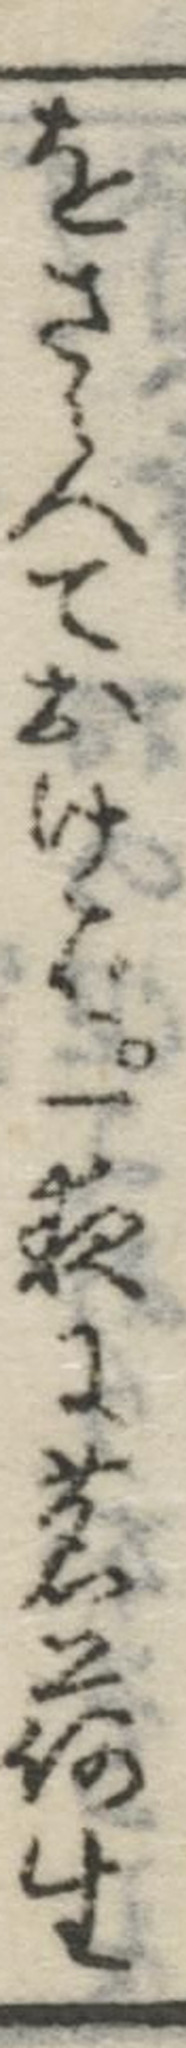をさゝへておけば。一夜に茗荷生
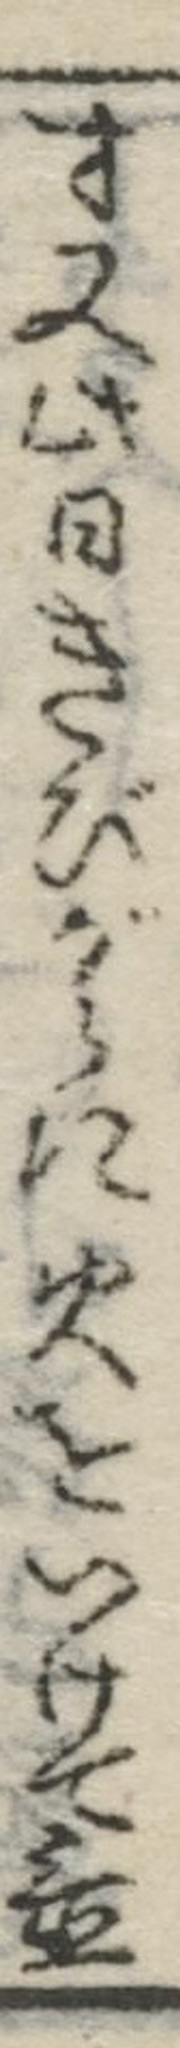す又此日きびがらに火をつけて置
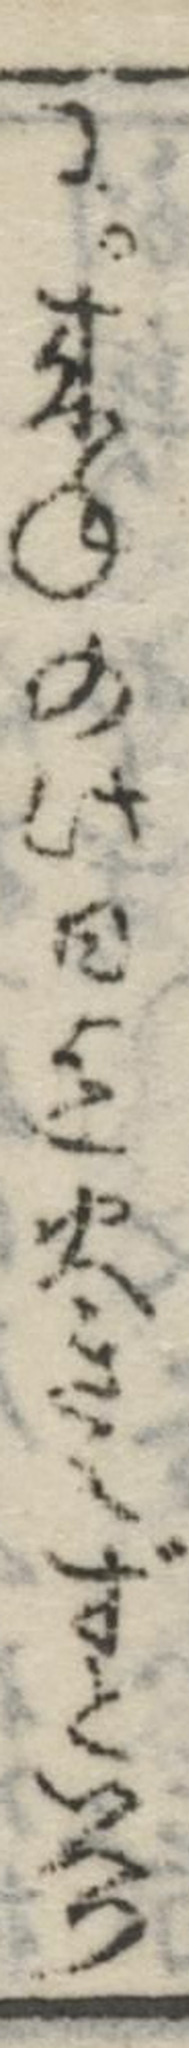に。来年の此日迄火きへずといへり
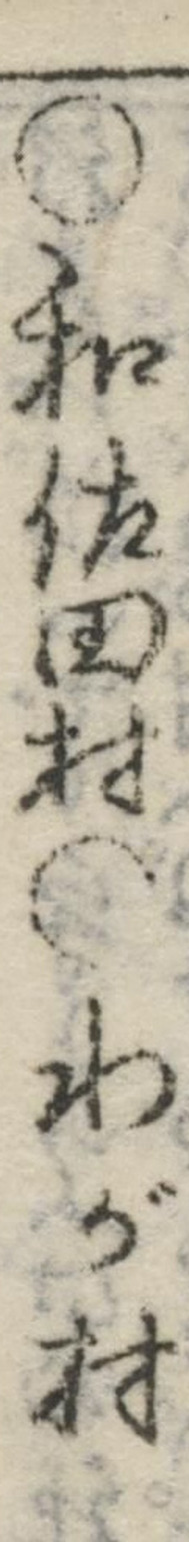○和佐田村○わが村
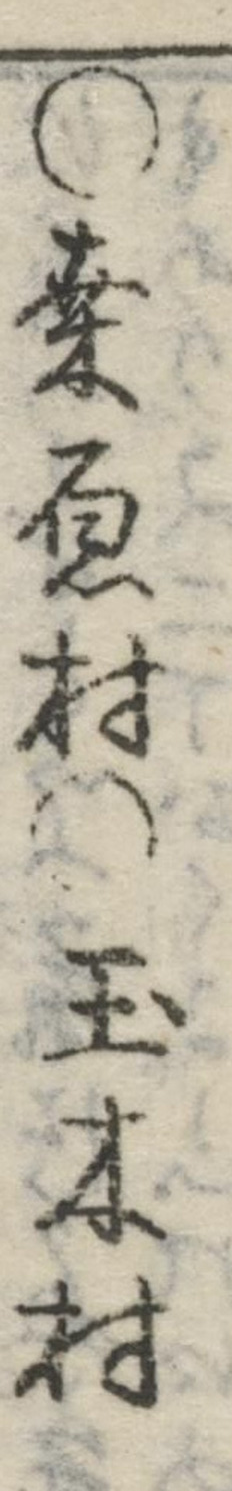○桑原村○玉木村
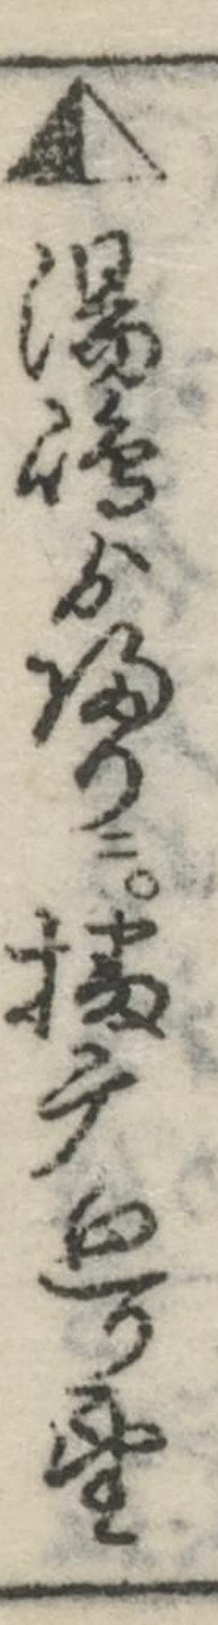▲湯嶋ゟ帰りに。播磨廻りの
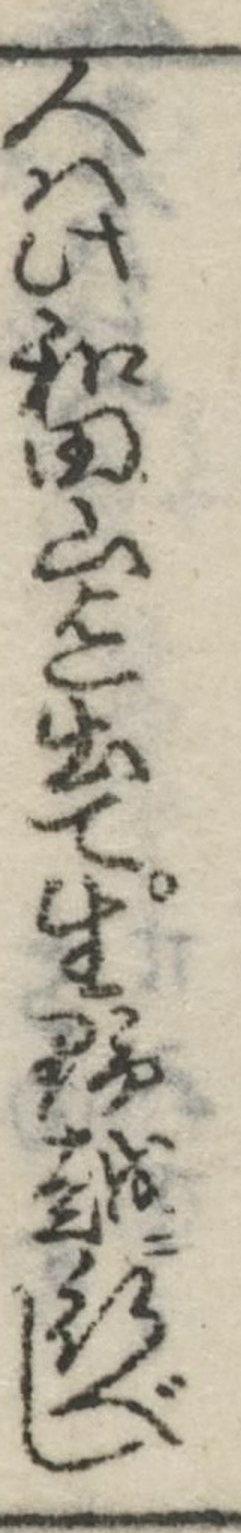人は此和田山迄出て。生野越に行べし
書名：但州城崎浴湯辧
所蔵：東京大学地震研究所図書室 Earthquake Research Institute Library, The University of Tokyo, JAPAN
